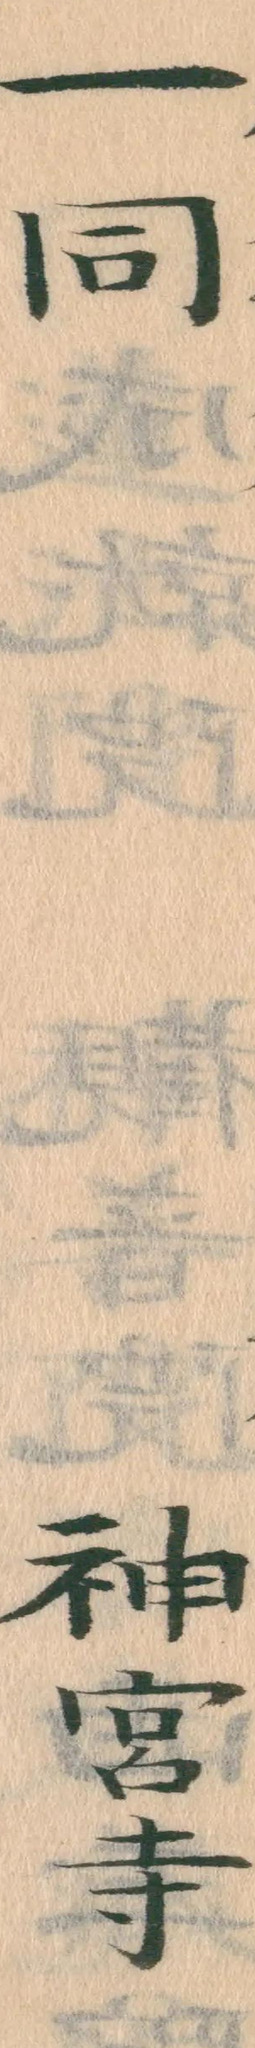一同神宮寺
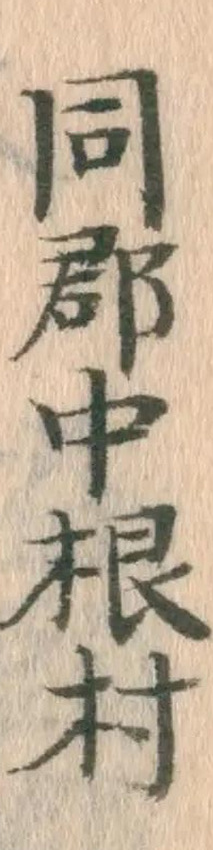同郡中根村
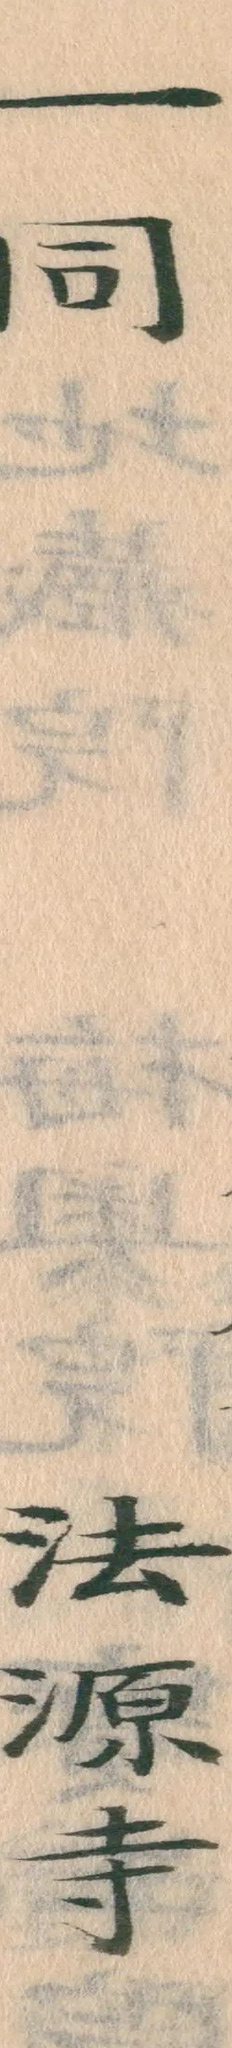一同法源寺
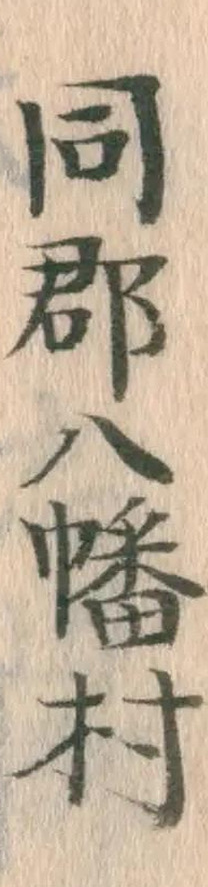同郡中根村
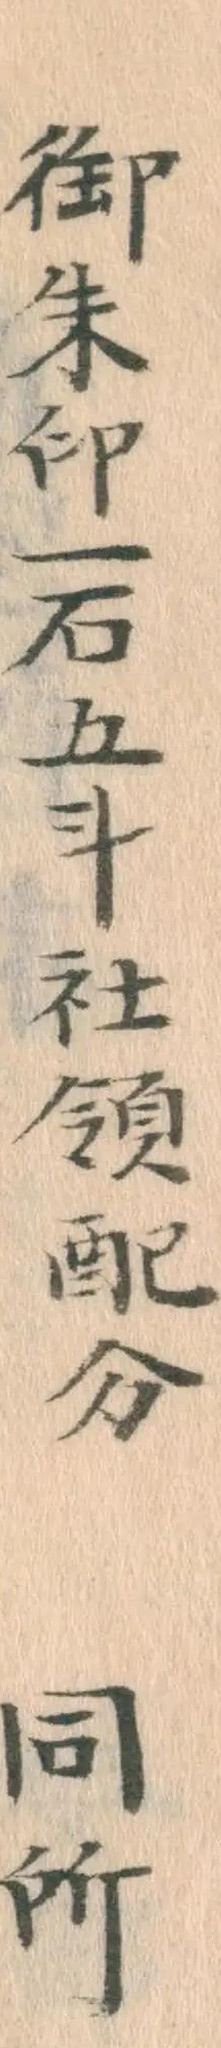御朱印一石五斗社領配分同所

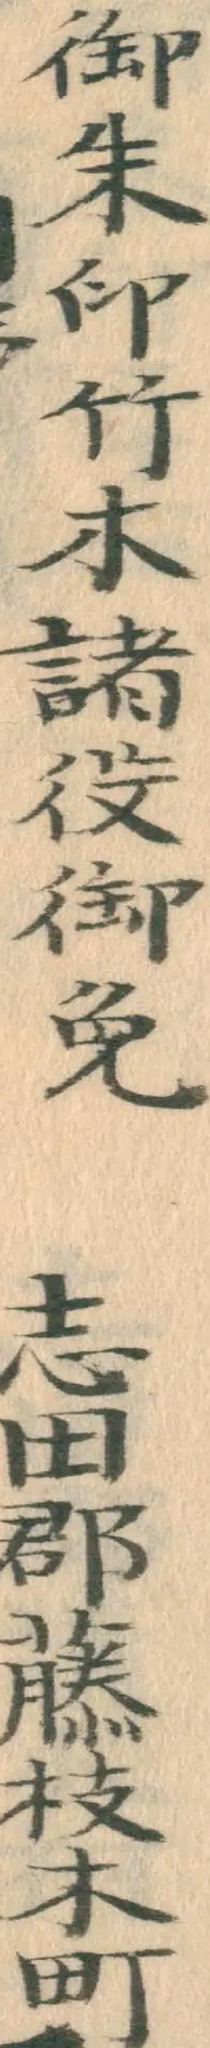御朱印竹木諸役御免志田郡藤枝木町
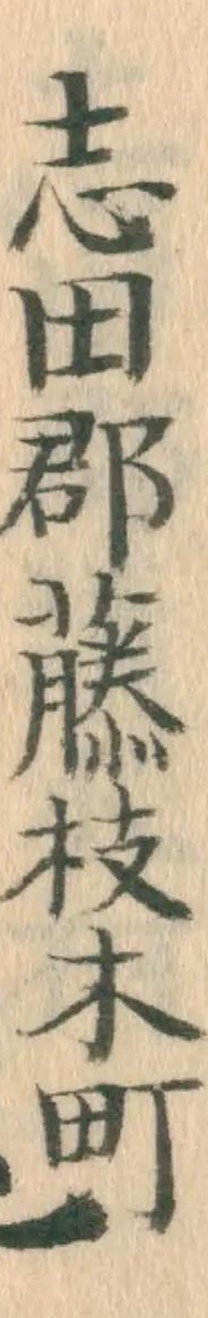志田郡藤枝木町
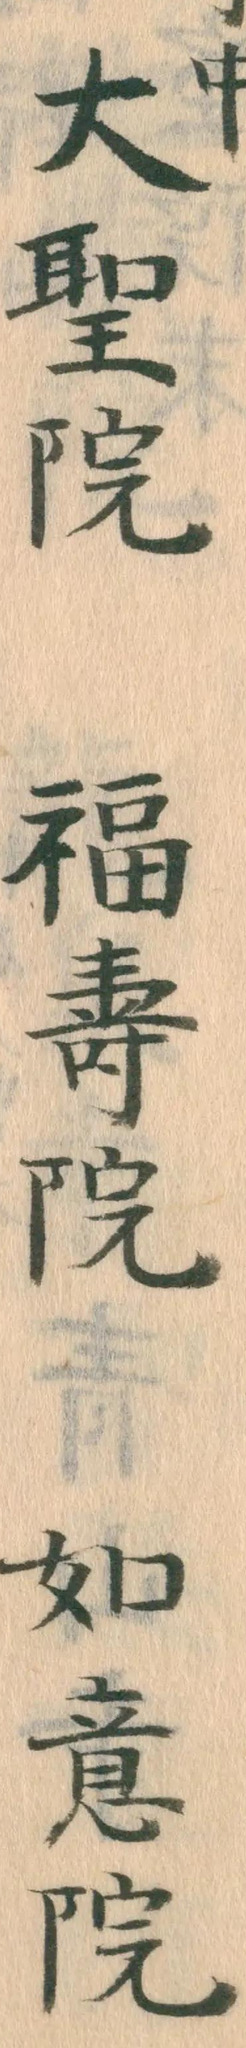大聖院福寿院如意院
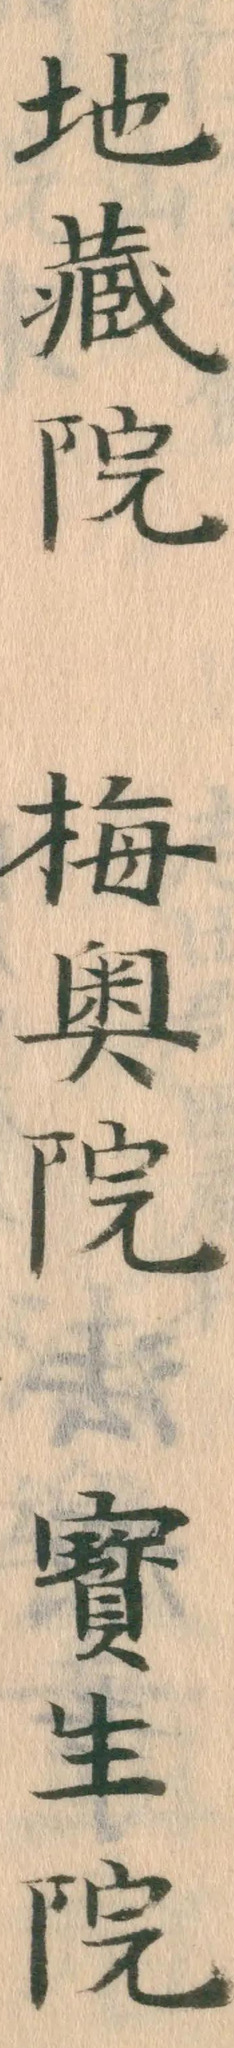地蔵院梅奥印宝生院
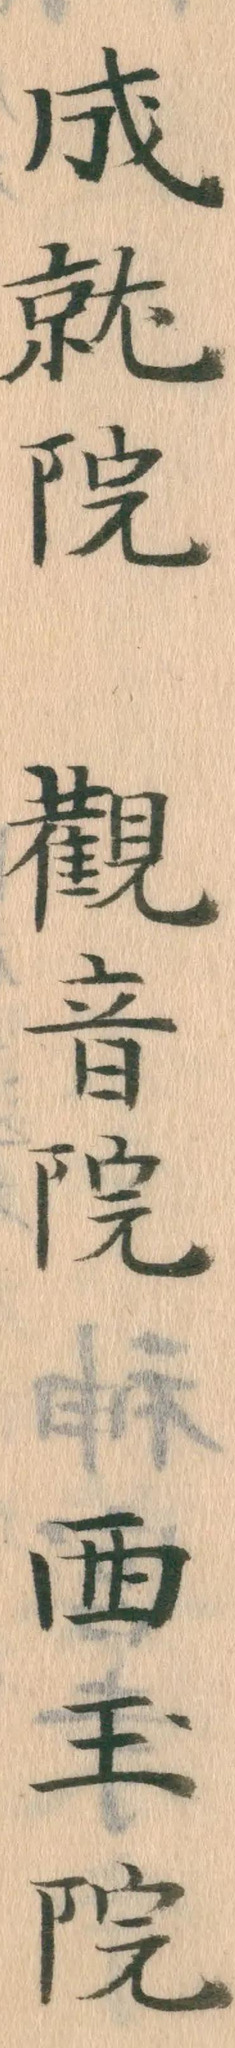成就院観音院西玉院
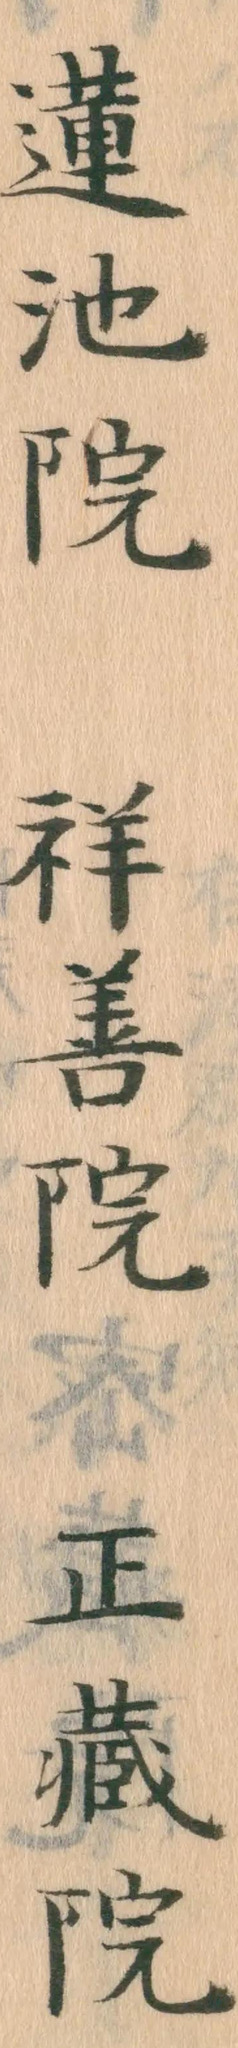蓮池院祥善院正蔵院
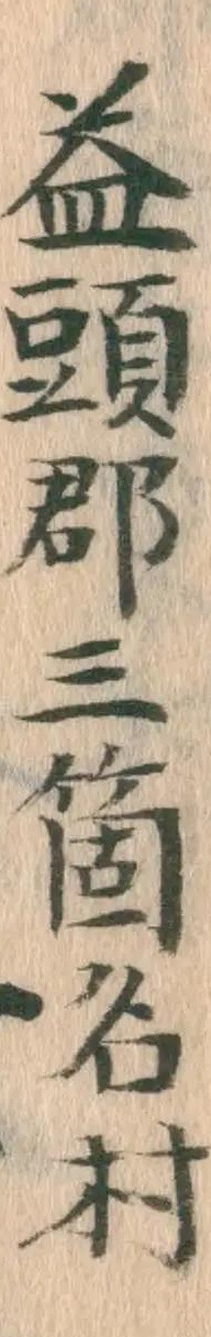益頭郡三箇名村
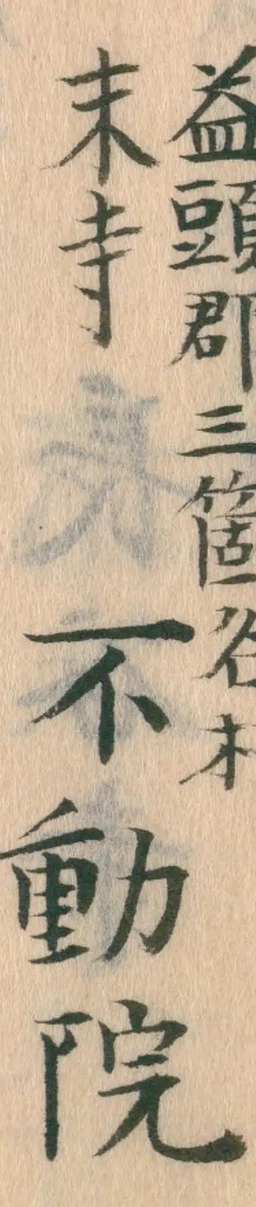未寺不動院
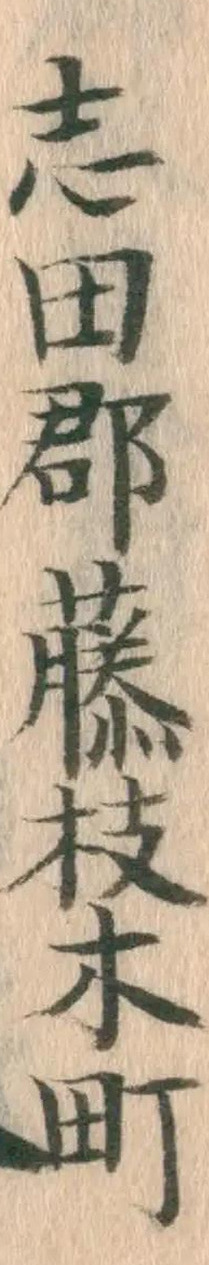志田郡藤枝木町
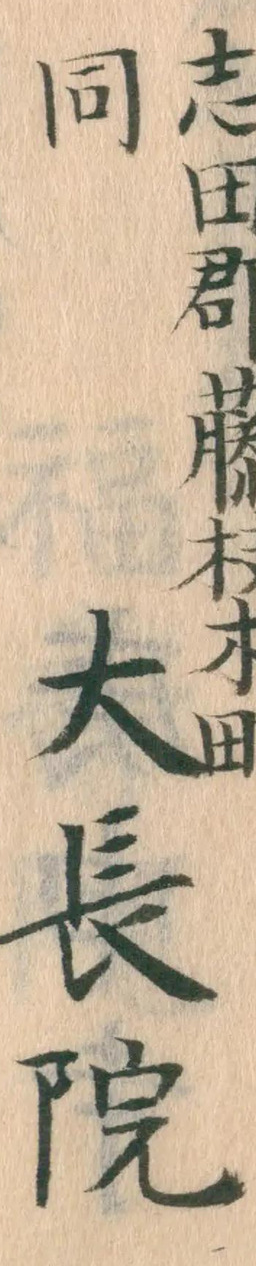同大長院
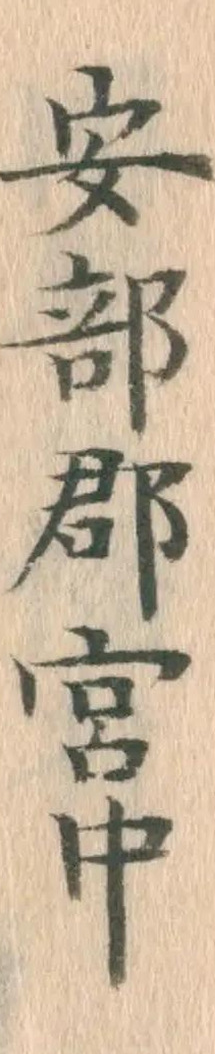阿部郡宮中
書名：古義真言宗本末帳 21巻. [4] 第三 伊賀国、伊勢国、志摩国、尾張国、三河国、遠江国、駿河国、伊豆国、甲斐国
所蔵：国立国会図書館 National Diet Library, JAPAN
